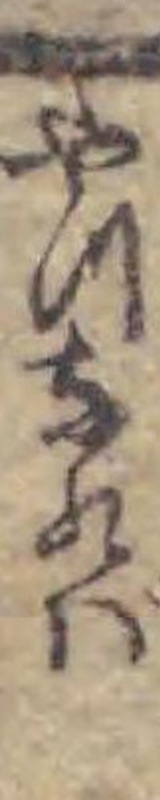やつなれば
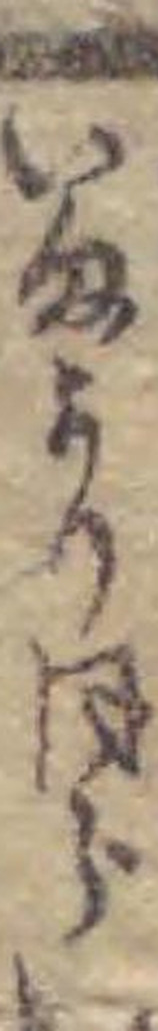いまよりほら
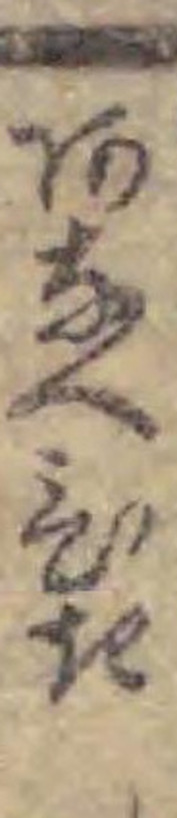あなへひき
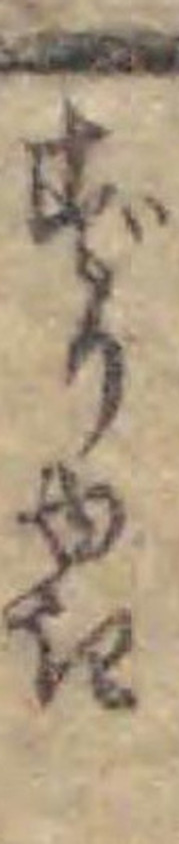ずりゆき
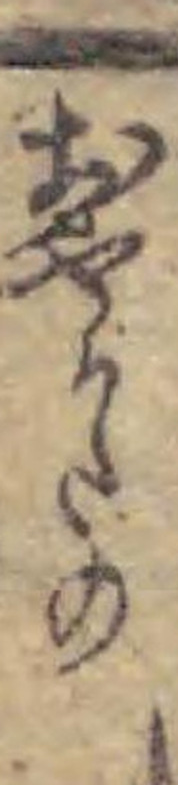おやかたの
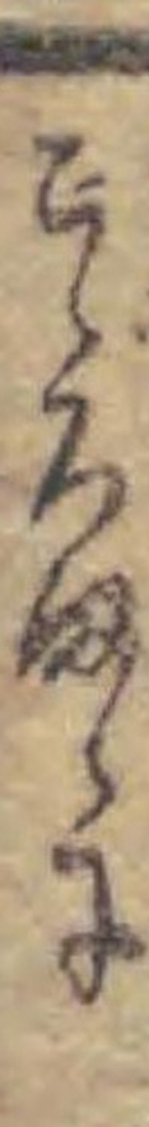こゝろまゝに
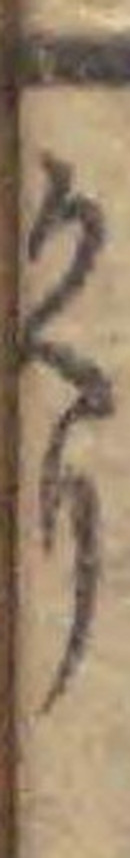かへり
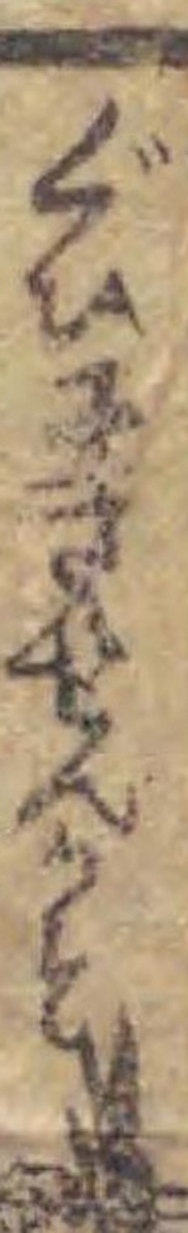ぐいにさせんかと
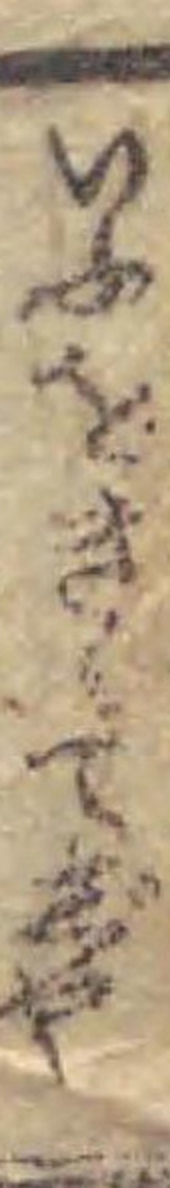いふをきゝてじや
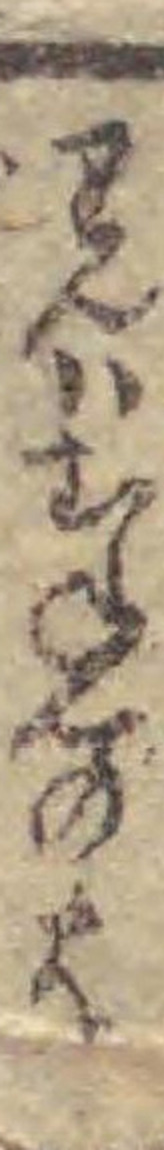りんはむねんのは
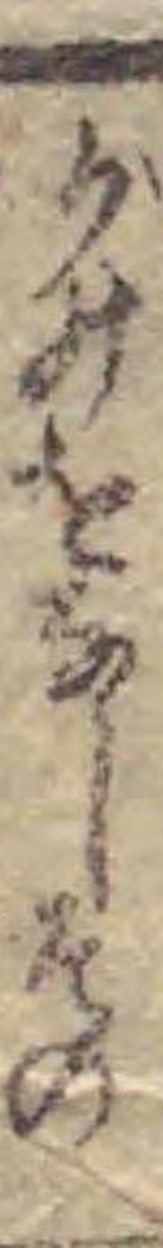がみをなしその
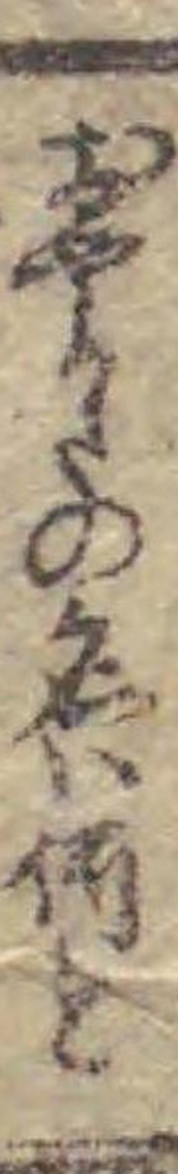おやかたの名は何と
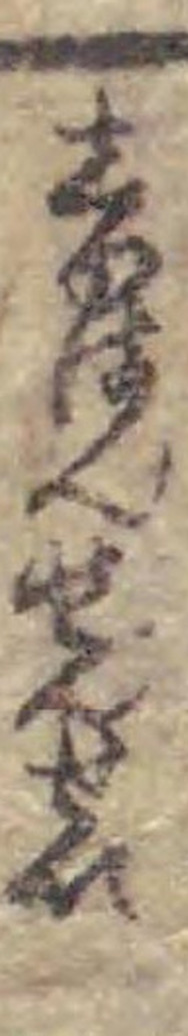しゆはんせんせい
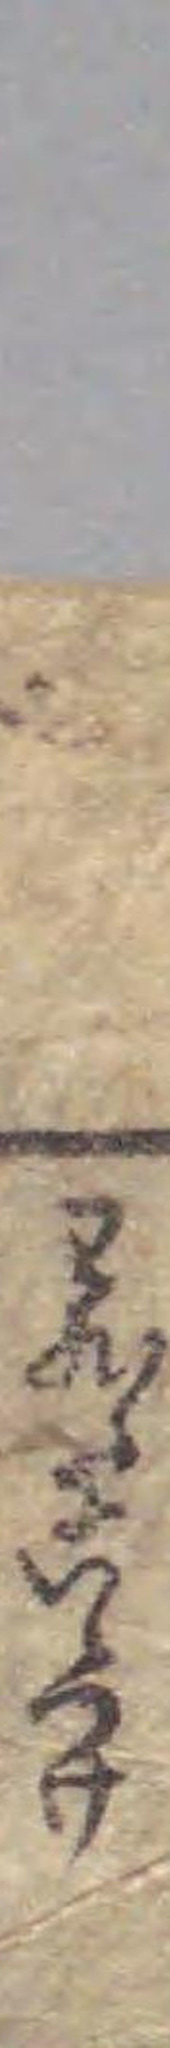われ〳〵にいゝつけ
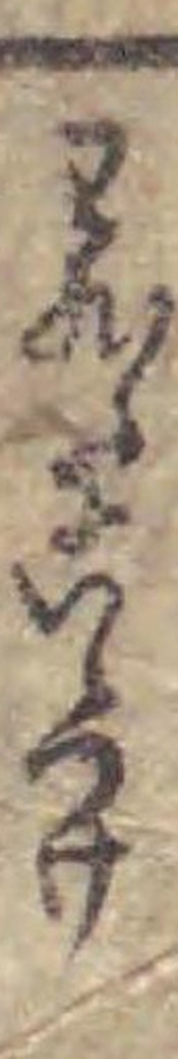われ〳〵にいゝつけ
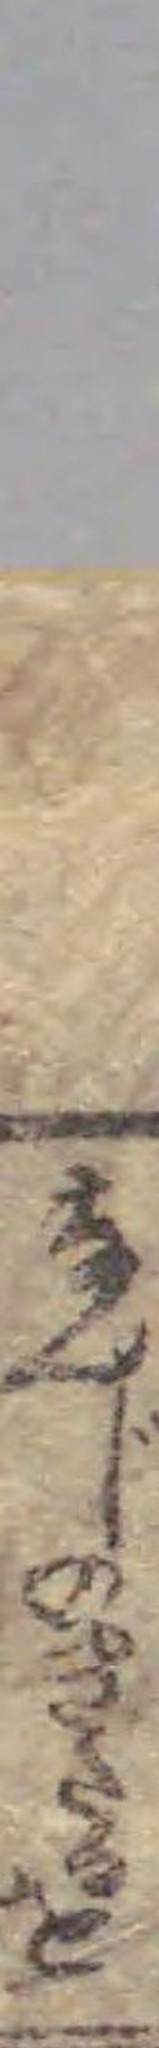なんじのきたるを
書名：化物世界夜半嵐 : 3巻
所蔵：国立国会図書館 National Diet Library, JAPAN
